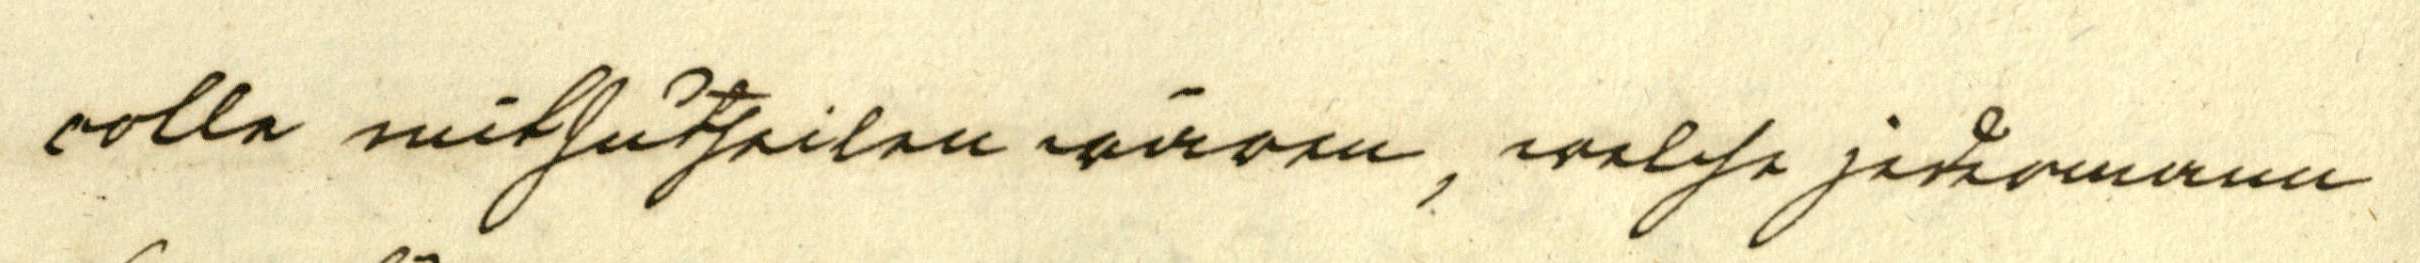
colle mitzutheilen wären, welche jedermann
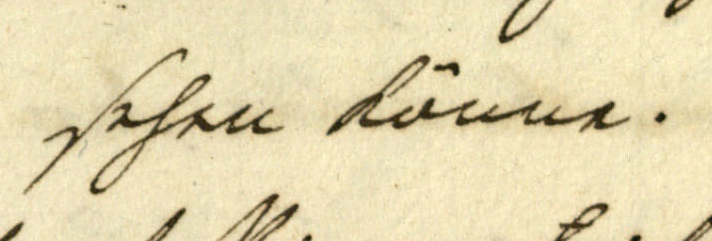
sehen könne.
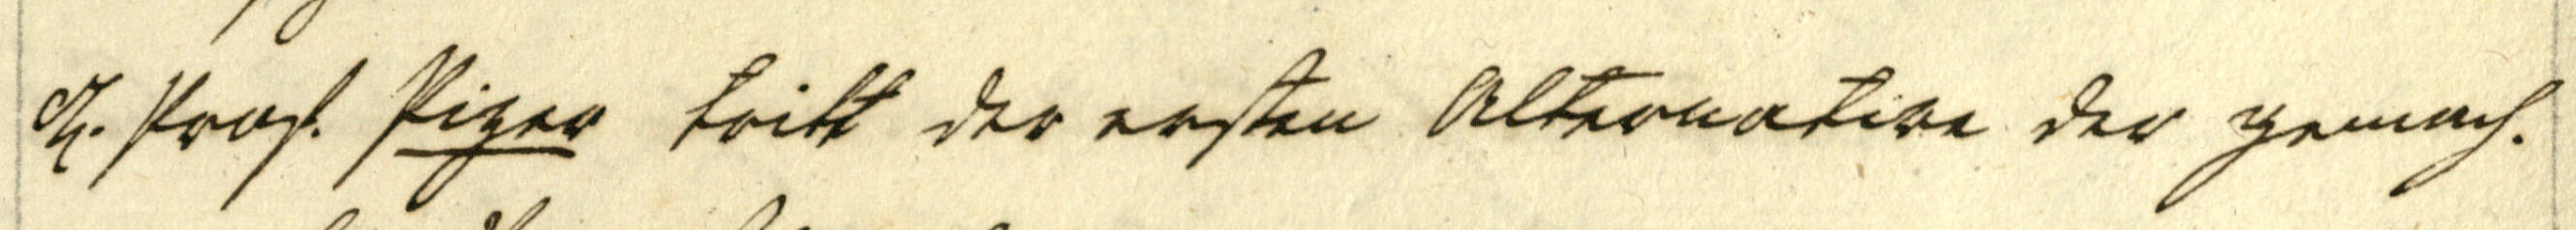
dh. Prof. Piper tritt der ersten Alternative der gemach¬
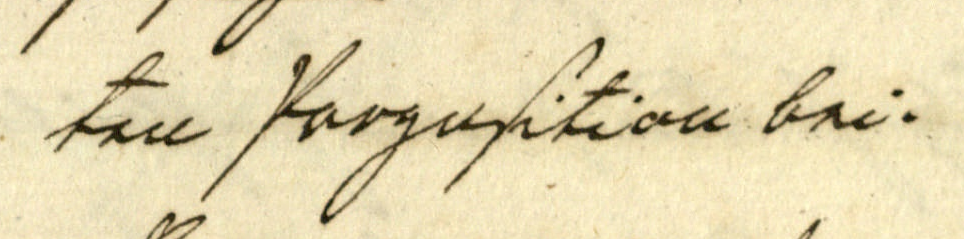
ten Proposition bei.
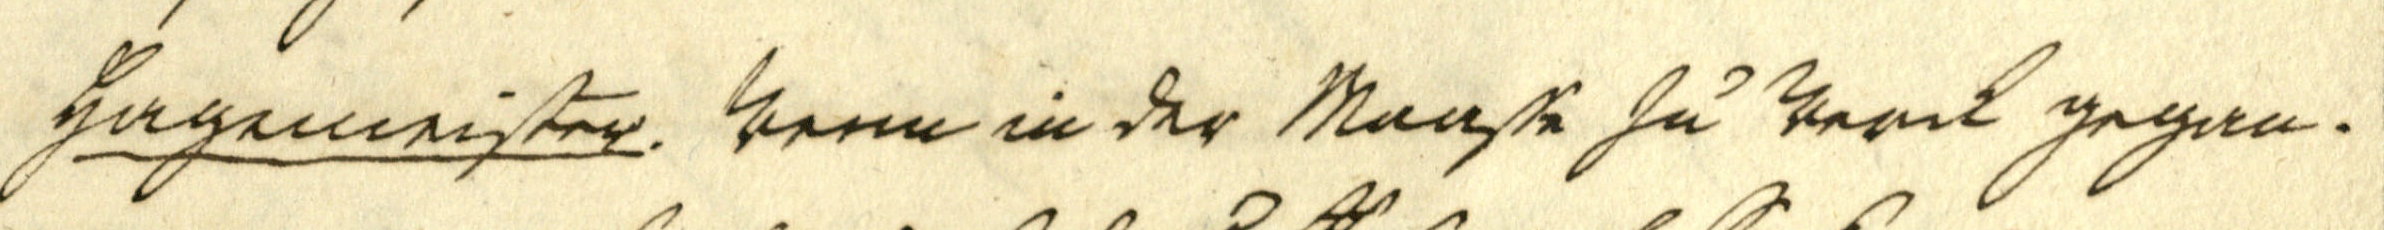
Hagemeister. Wenn in der Maasse zu Werck gegan¬
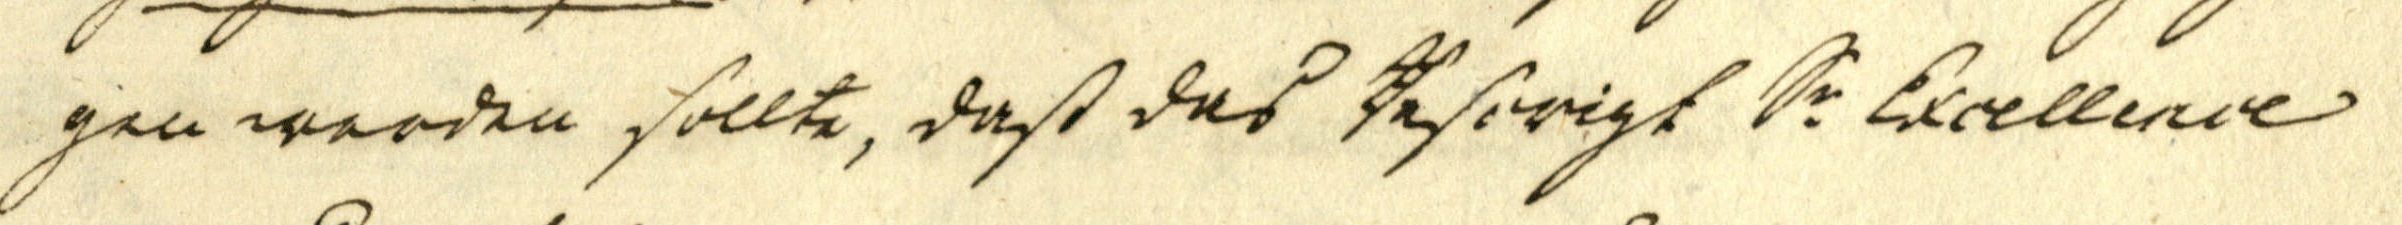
gen werden sollte, daß das Rescript Sr Excellence
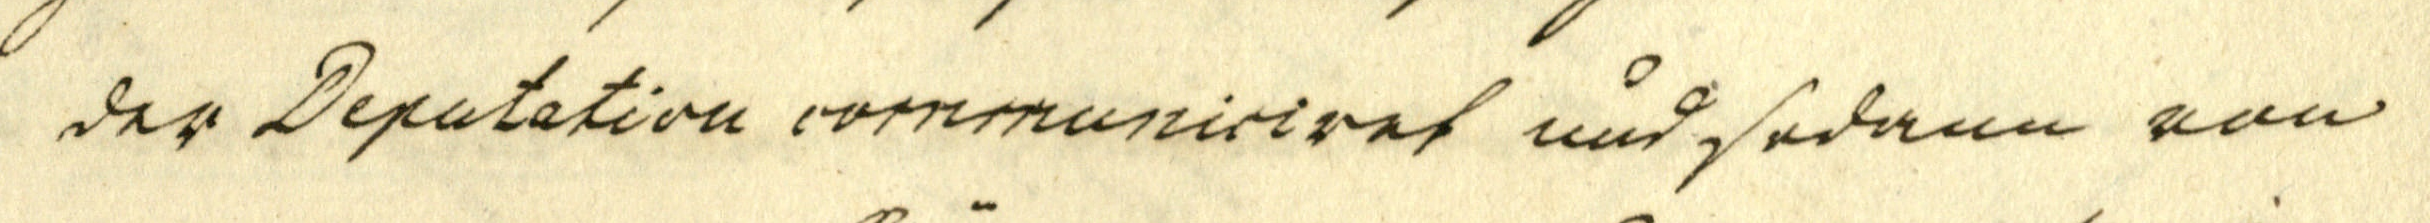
der Deputation communiciret und sodann von
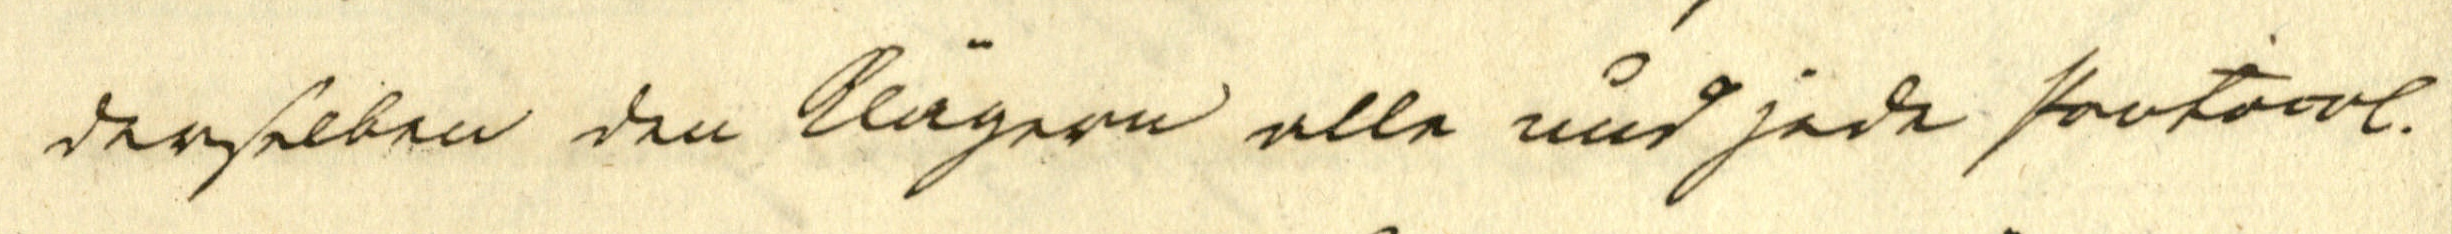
derselben den Klägern alle und jede Protocol¬
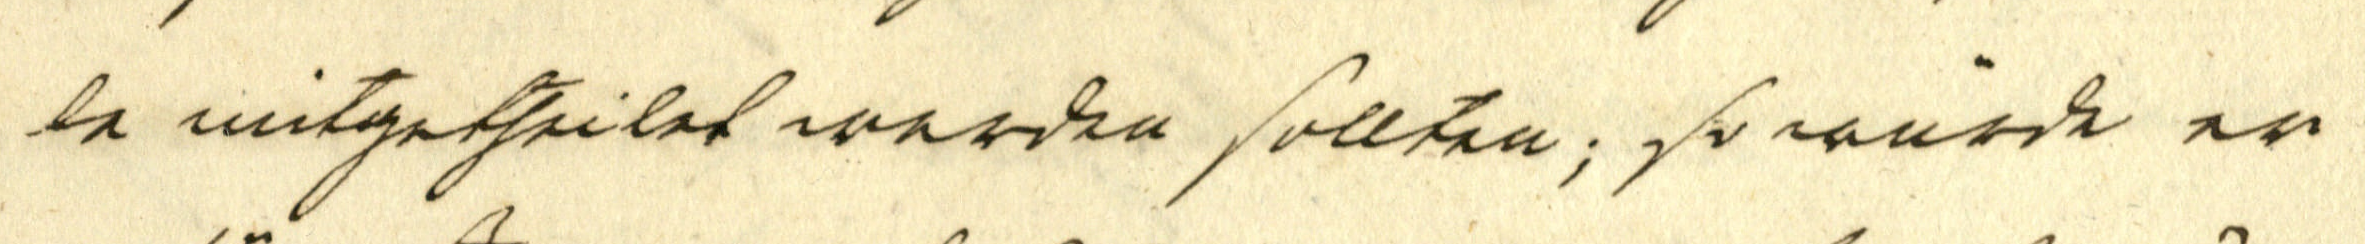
de mitgetheilet werden sollten, so würde er
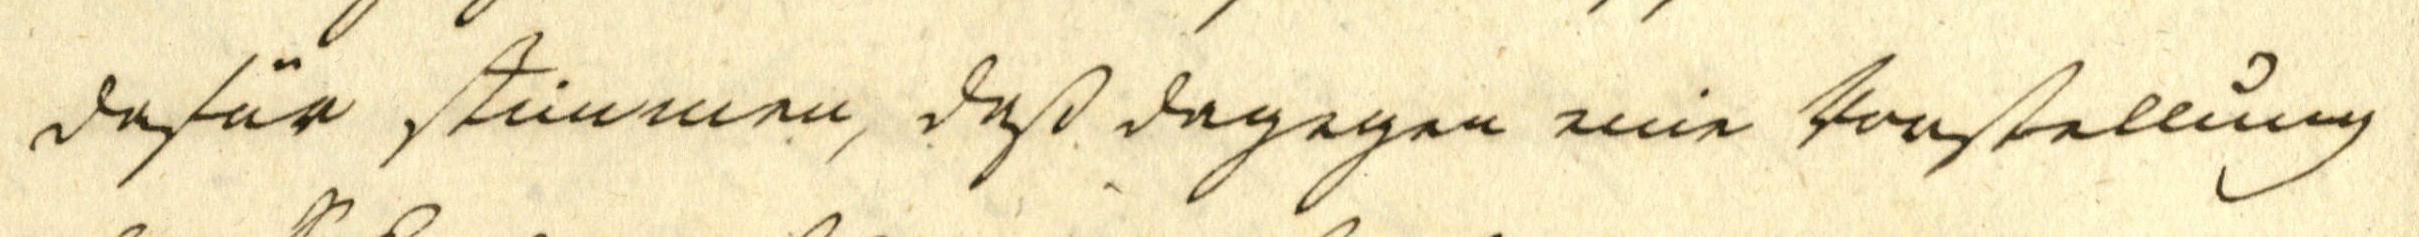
dafür stimmen, daß dagegen eine Vorstellung
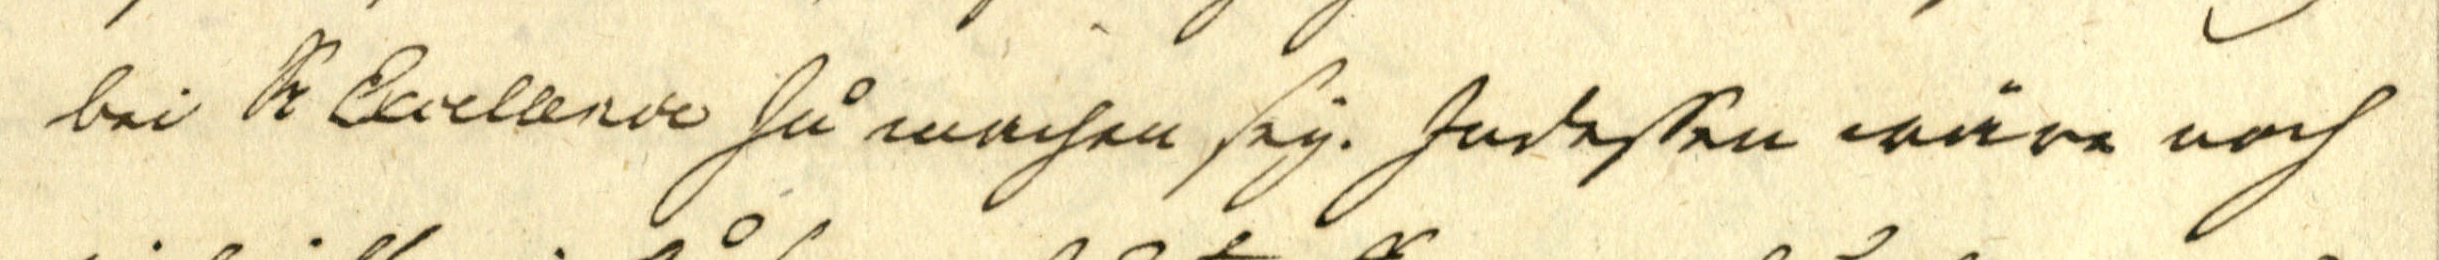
bei Sr Excellence zu machen seÿ. Indessen wäre noch
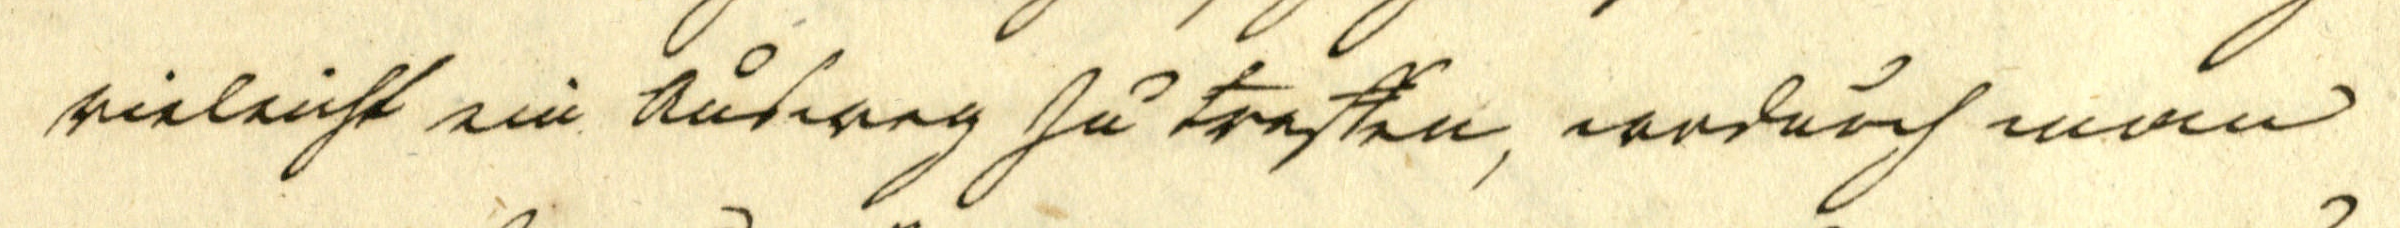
vieleicht ein Ausweg zu treffen, wodurch man
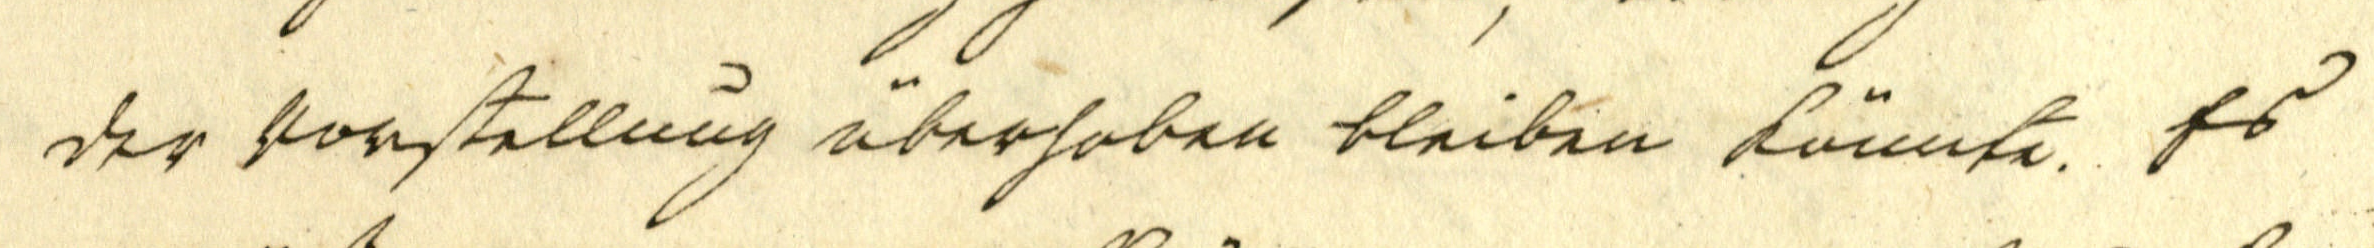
der Vorstellung überhoben bleiben könnte. Es
